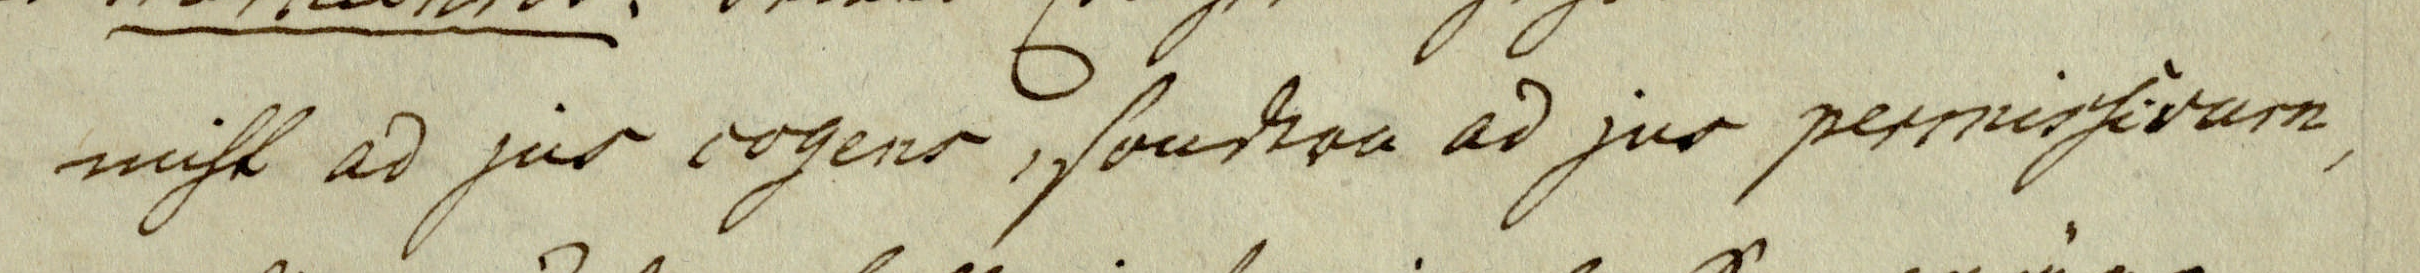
nicht ad jus cogens, sondern ad jus permissivum,
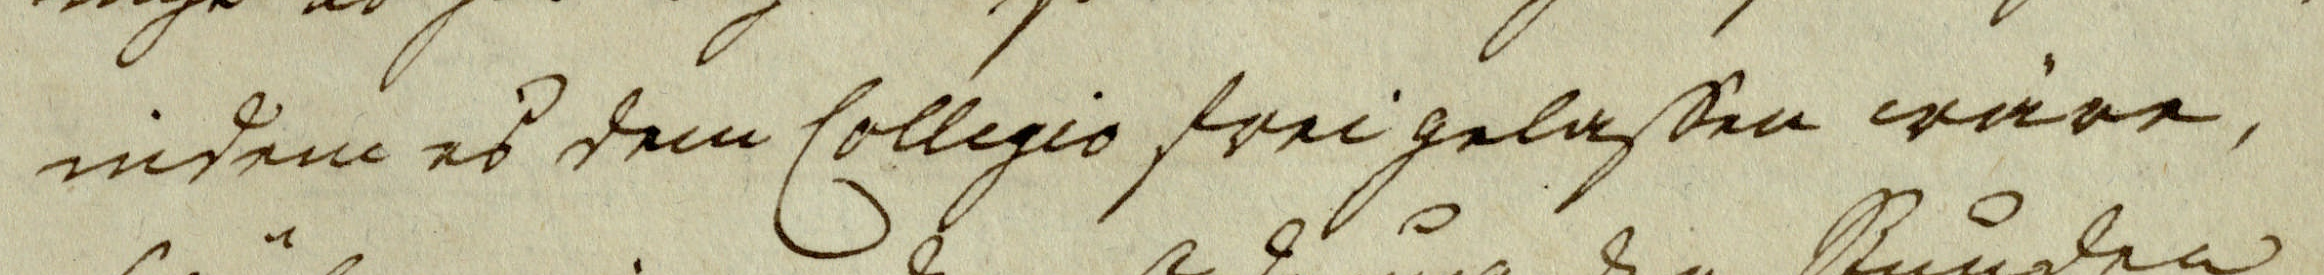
indem es dem Collegio frei gelassen wäre,
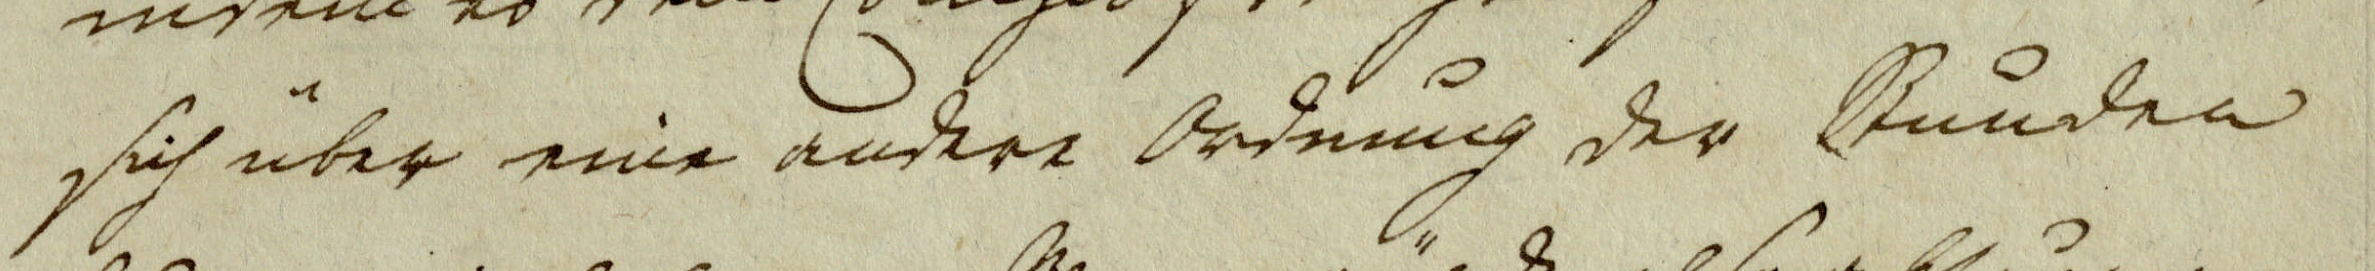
sich über eine andere Ordnung der Stunden
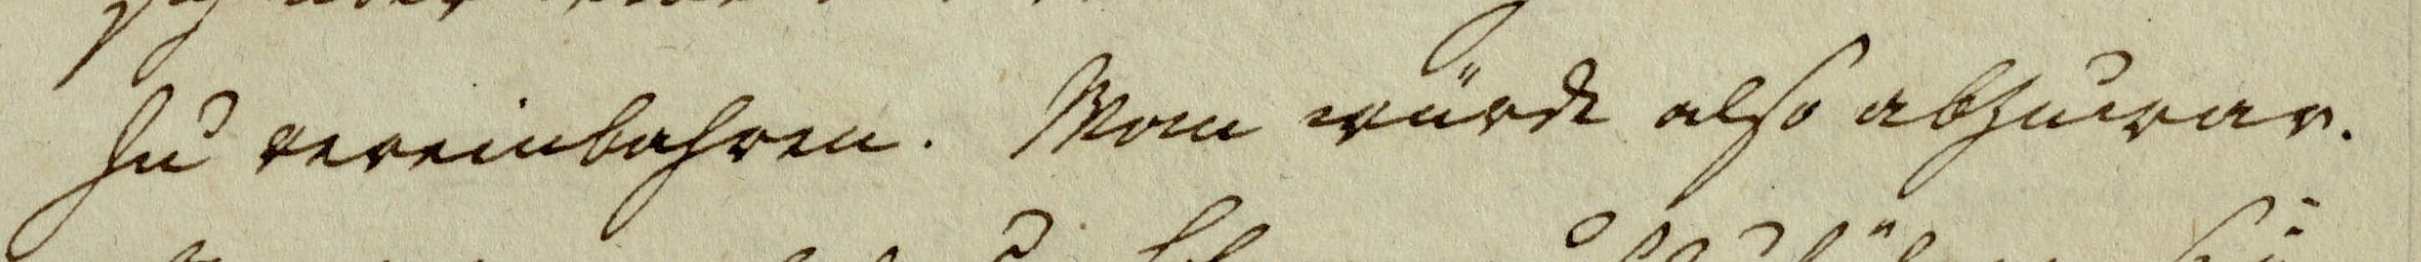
zu vereinbahren. Man würde also abzuwar¬
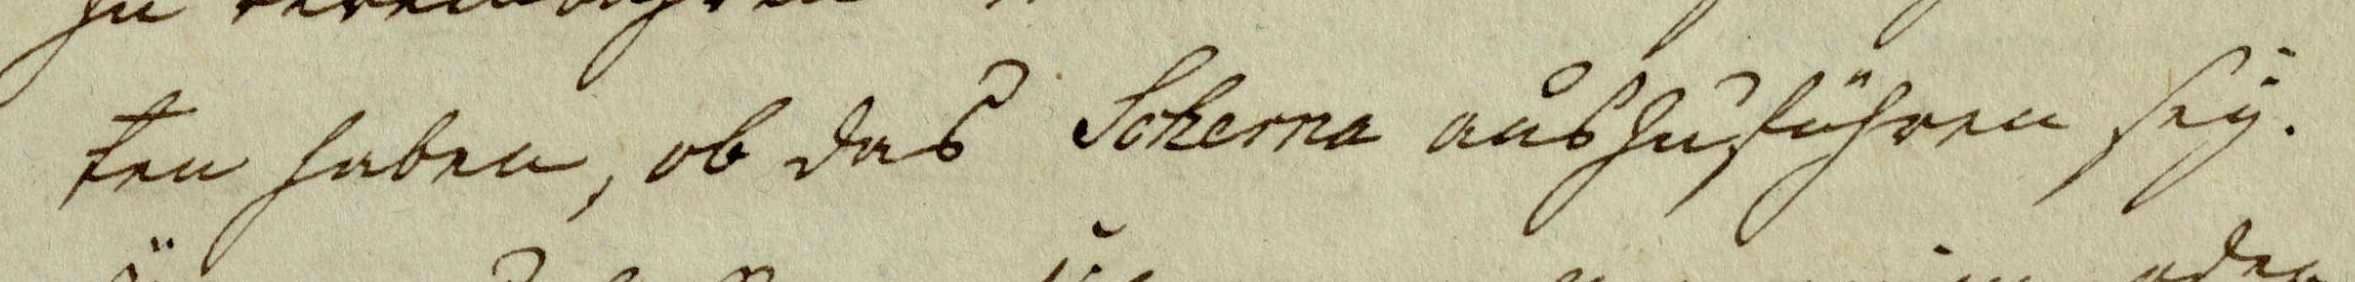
ten haben, ob das Schema auszuführen seÿ.
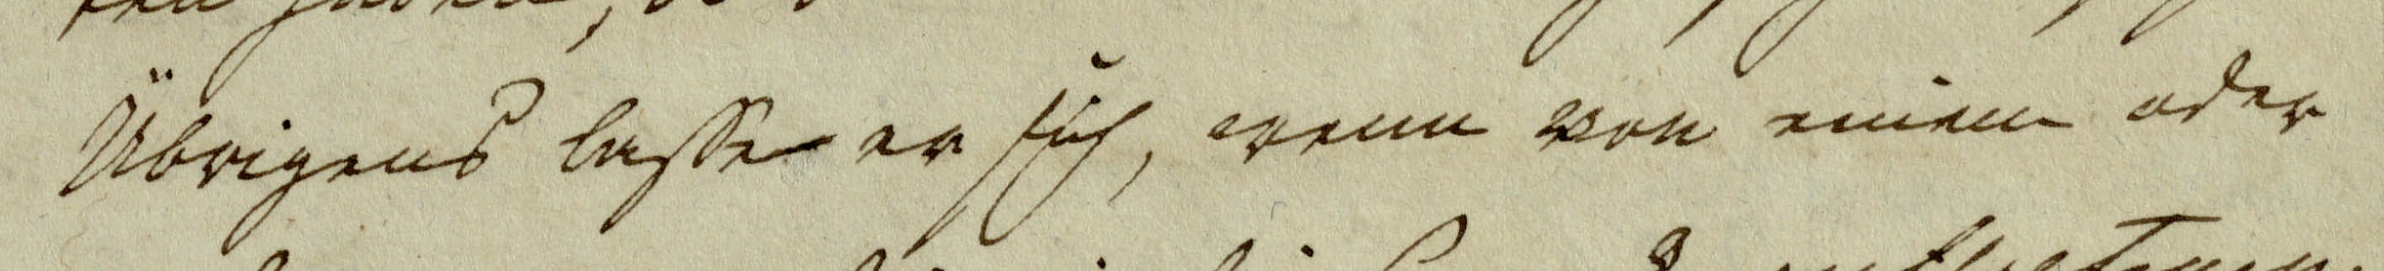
Übrigens lasse er sich, wenn von einem oder
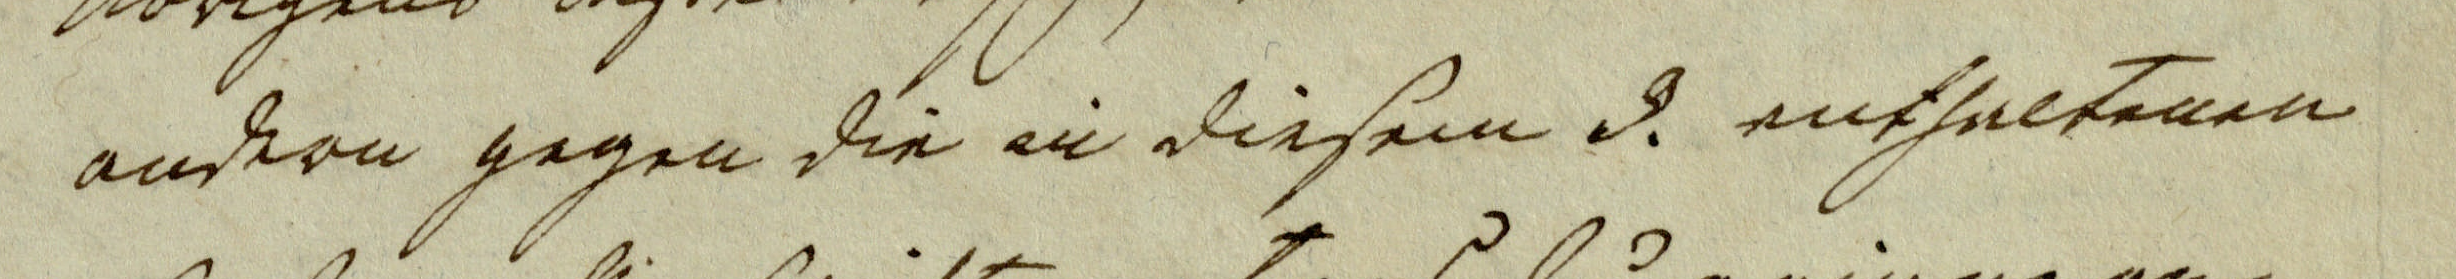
andern gegen die in diesem §. enthaltenen
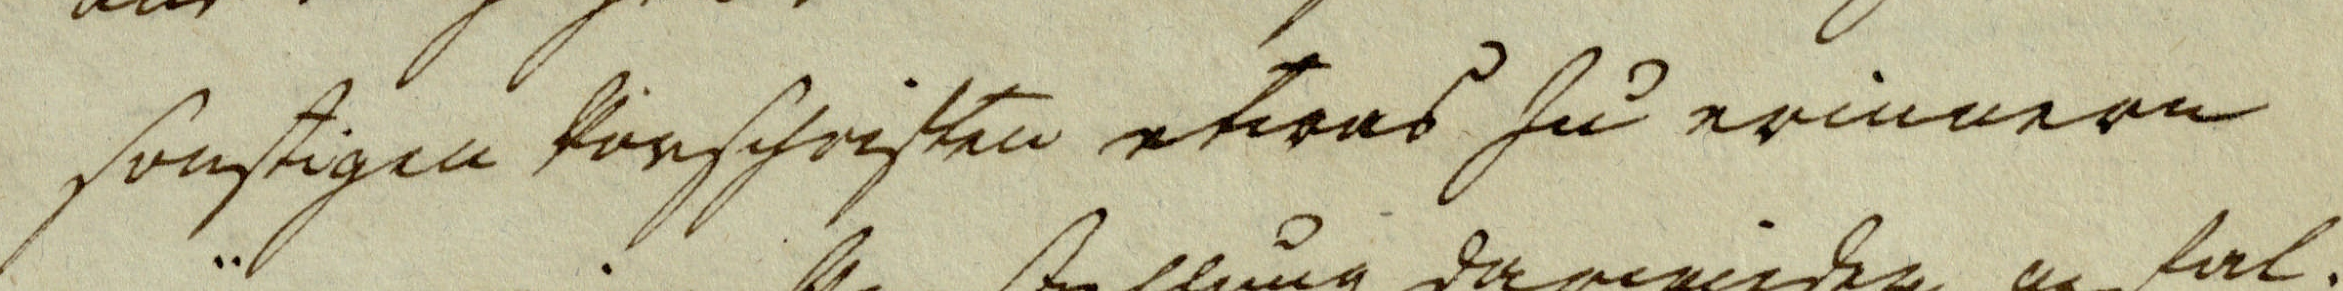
sonstigen Vorschriften etwas zu erinnern
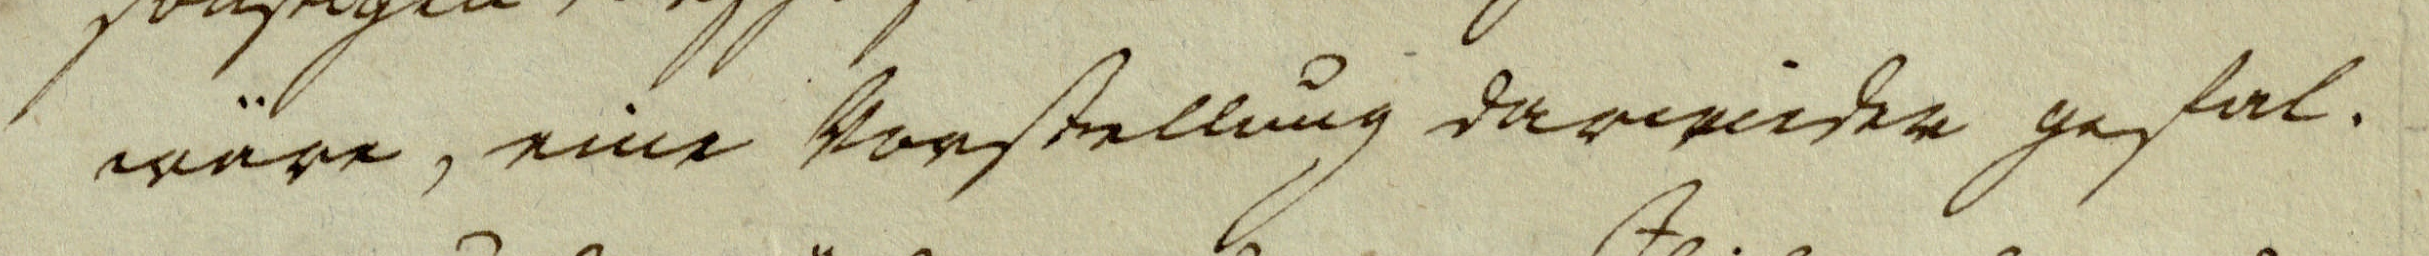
wäre, eine Vorstellung darwieder gefal¬
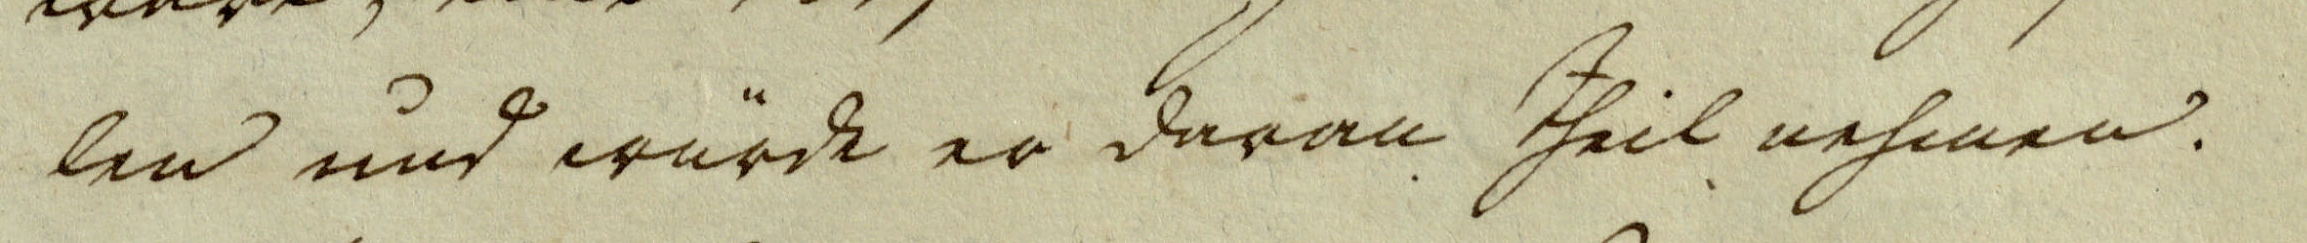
len und würde er daran Theil nehmen.
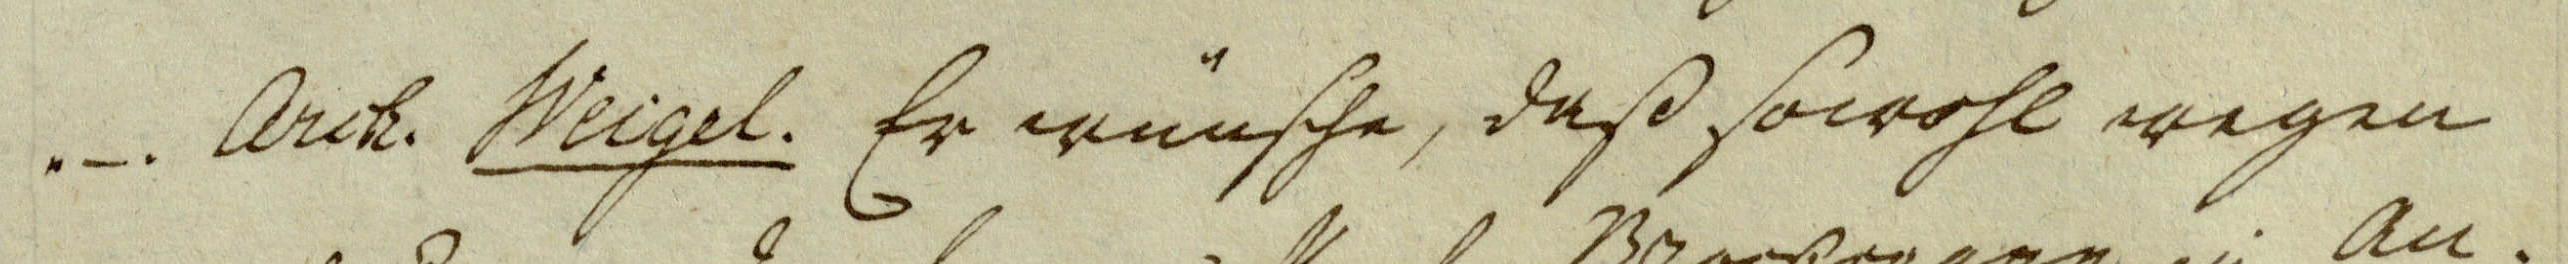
Arch. Weigel. Er wünsche, daß sowohl wegen
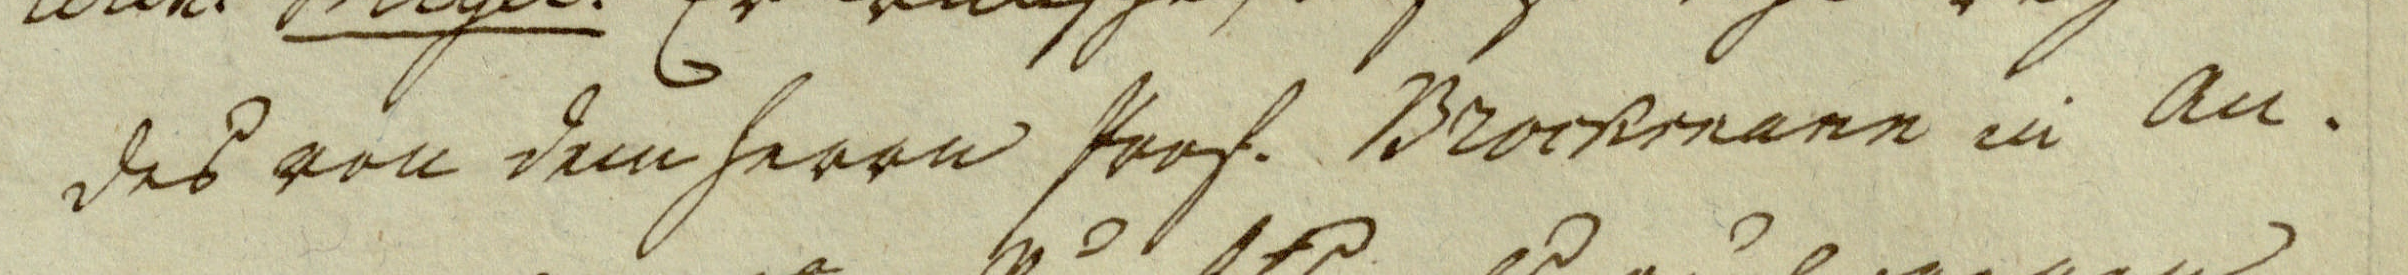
des von dem Herrn Prof. Brockmann in An¬
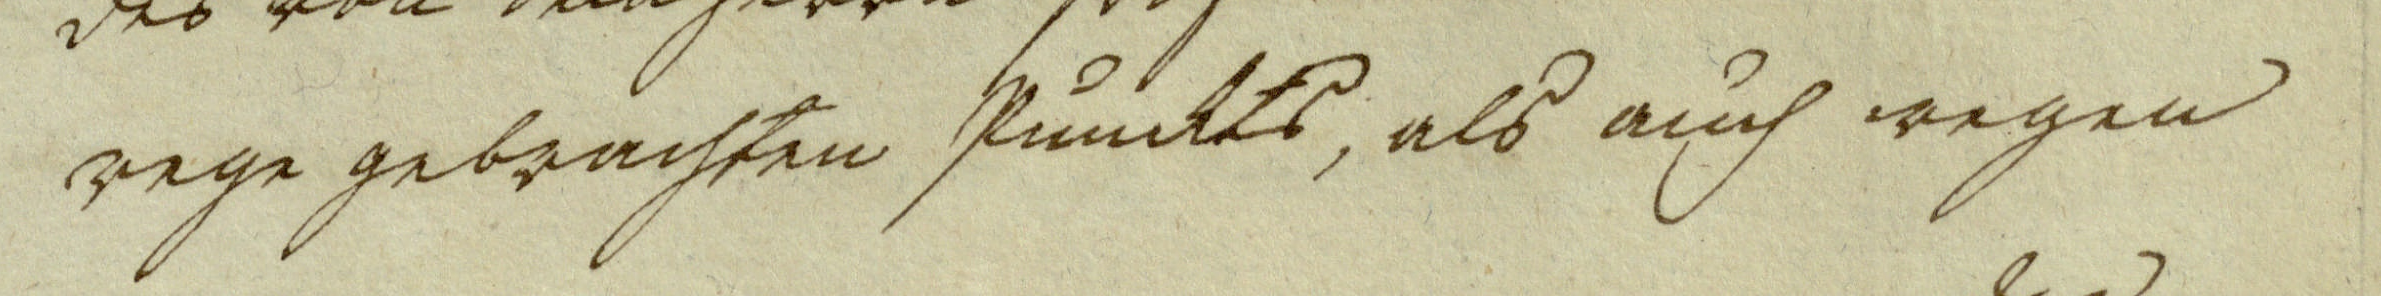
rege gebrachten Punckts, als auch wegen
